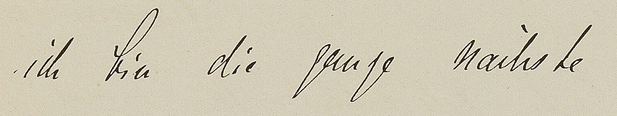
ich bin die ganze nächste
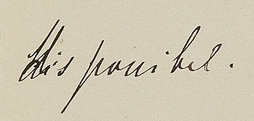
disponibel.
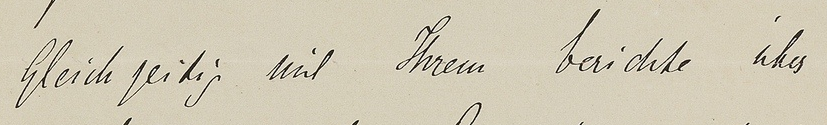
Gleichzeitig mit Ihrem Berichte über
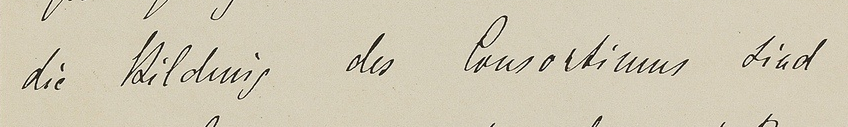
die Bildung des Consortiums sind
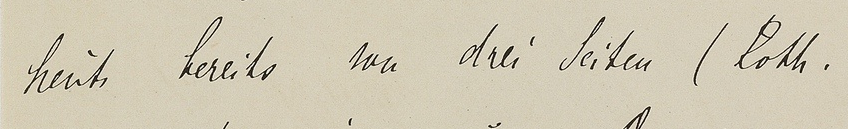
heute bereits von drei Seiten (Roth-
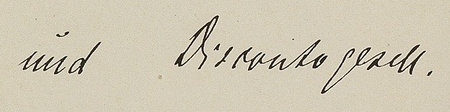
und Discontogesell-
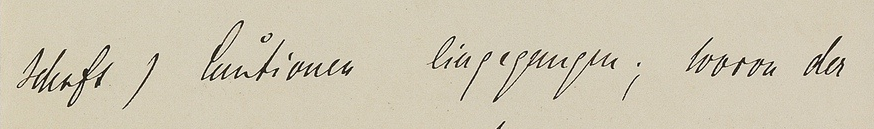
schaft) Cautionen eingegangen; wovon der
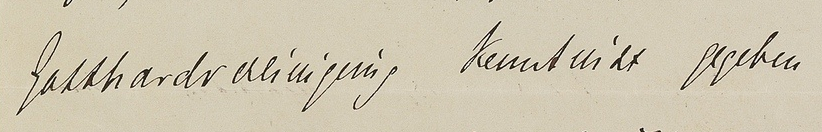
Gotthardvereinigung Kenntniss gegeben
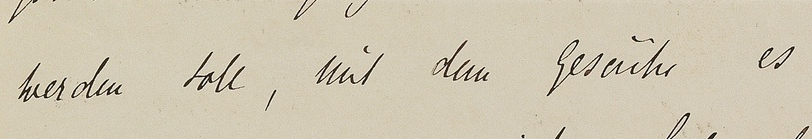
werden soll, mit dem Gesuche es
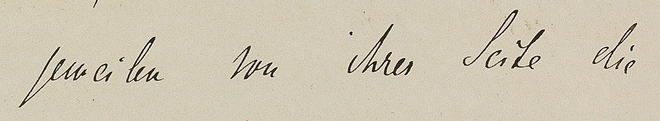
jeweilen von ihrer Seite die
